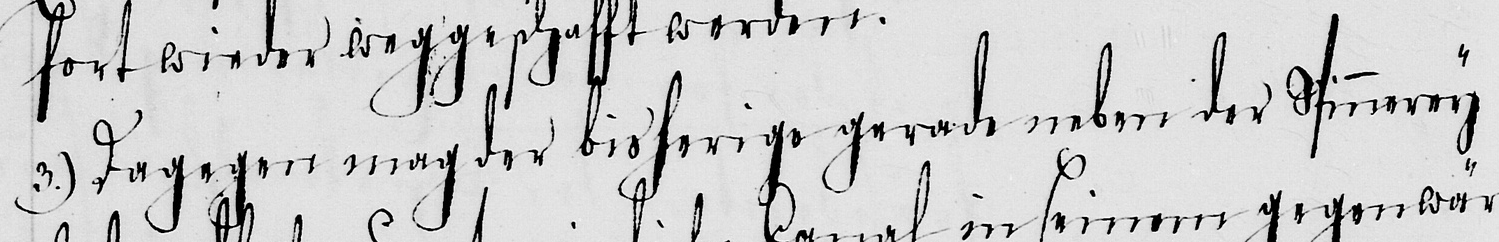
3.) Dagegen mag der bisherige gerade neben der Spinnerey
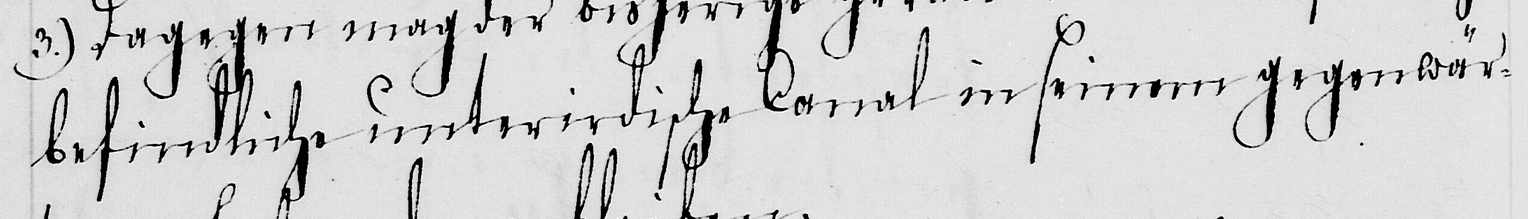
befindliche unterirdische Canal in seinem gegenwär¬
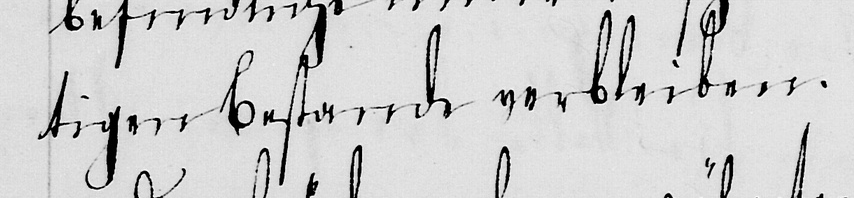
tigen Bestande verbleiben.
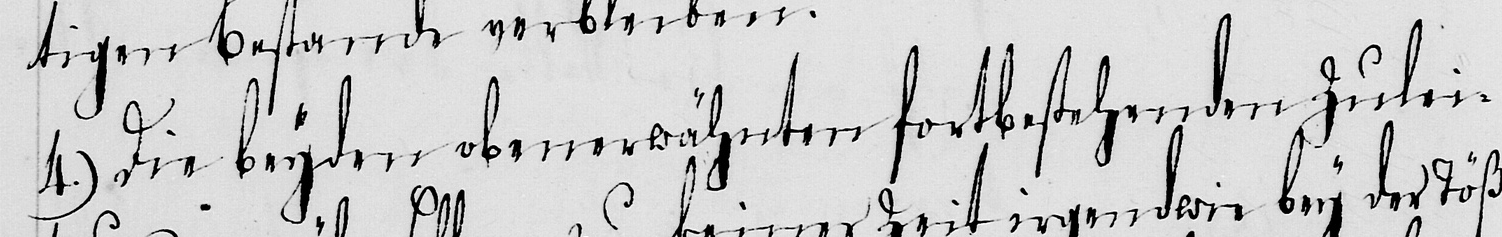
4.) Die beyden obenerwähnten fortbestehenden Zulei¬
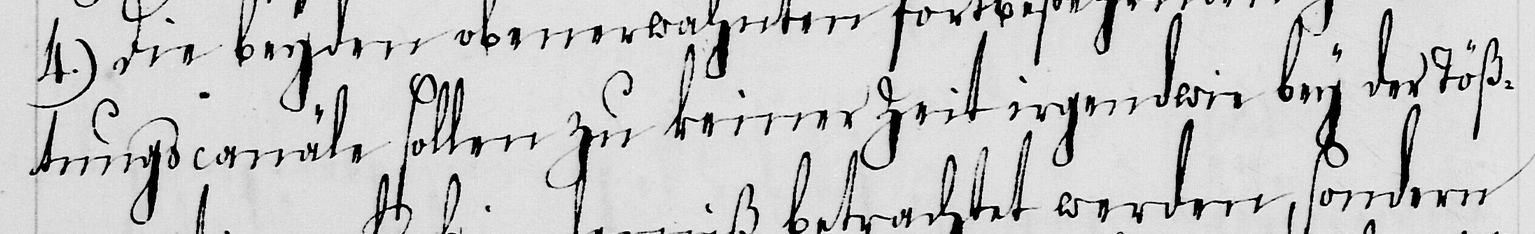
tungscanäle sollen zu keiner Zeit irgendwie bey der Töß¬
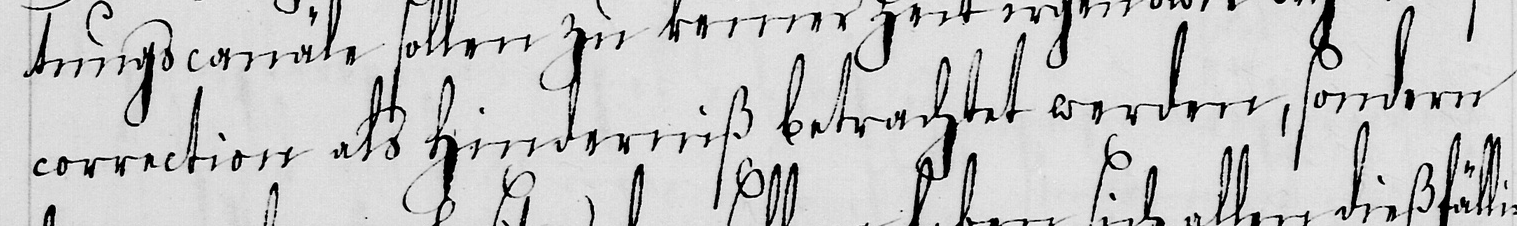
correction als Hinderniß betrachtet werden, sondern
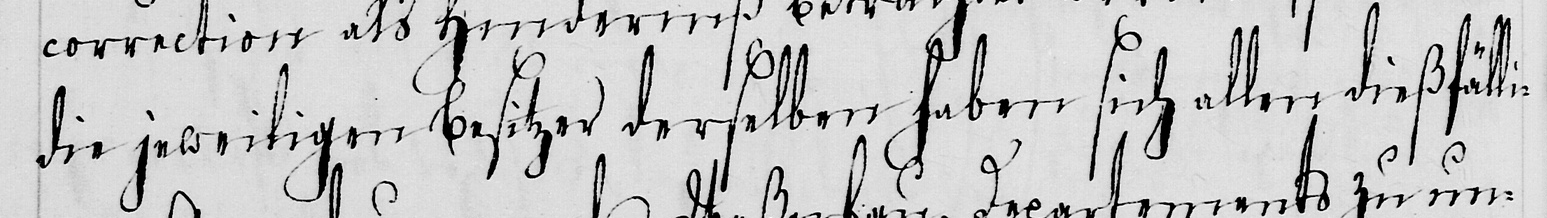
die jeweiligen Besitzer derselben haben sich allen dießfäll¬
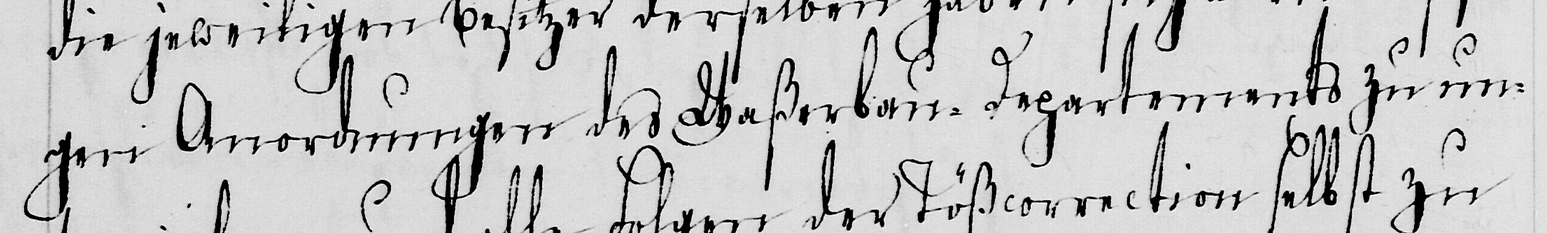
igen Anordnungen des Waßerbau-Departements zu un¬
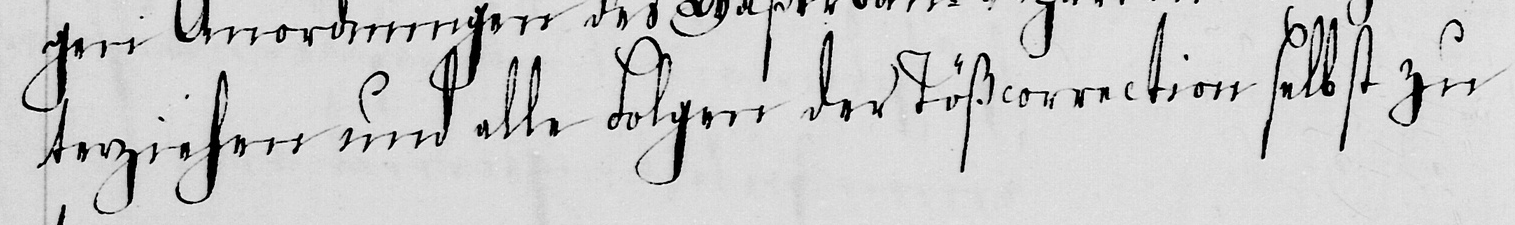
terziehen und alle Folgen der Tößcorrection selbst zu
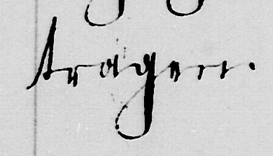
tragen.
